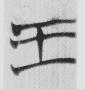王
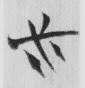必
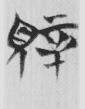親
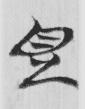見
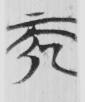而
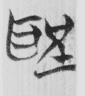聖
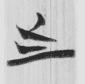之
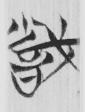{小言戈}
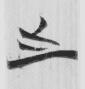之
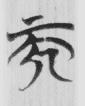而
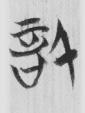信
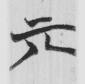亓
